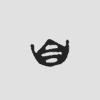自
